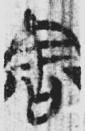舍（予）
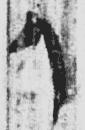人
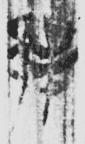邦
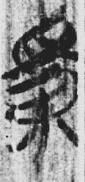○（家）
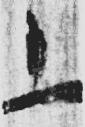土
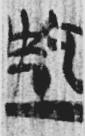○（地）
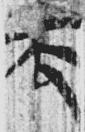而
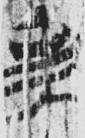民
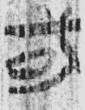或
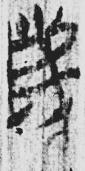弗
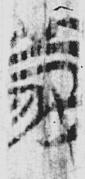義
